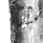卯
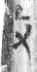○（媚）
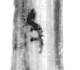於
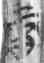晨
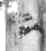凡
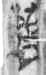○（陷）
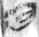日
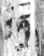不
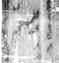利（利）
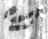㠯（以）
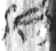利（利）
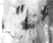㠯（以）
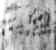爲
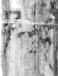張
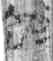罔（網）
